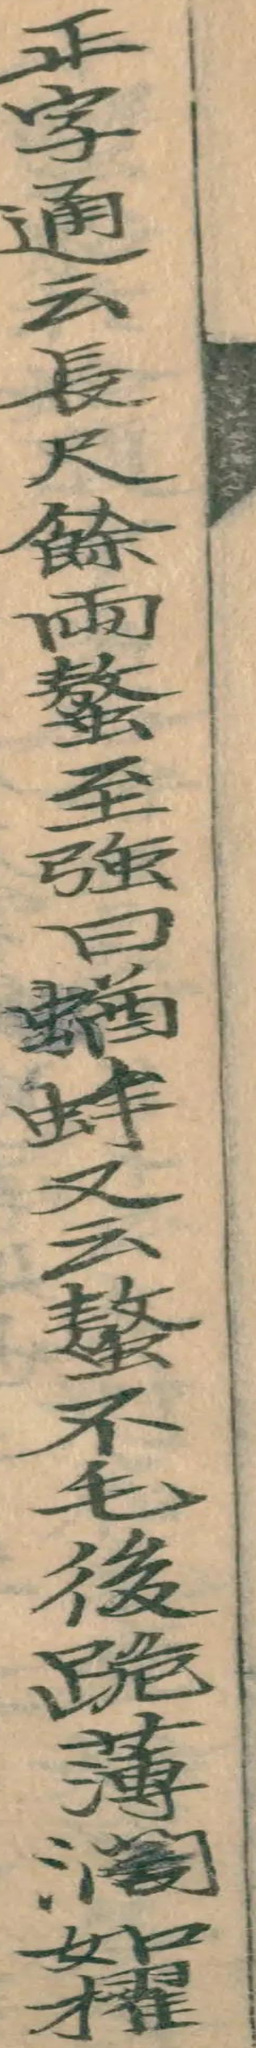正字通云長尺餘両螯至強曰蝤蛑又云螯不毛後跪薄濶如櫂
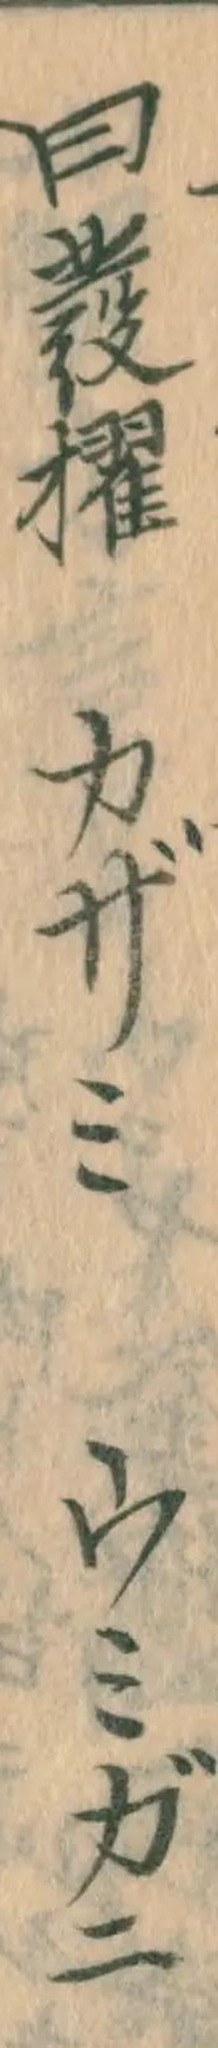曰發櫂カザミウミガニ

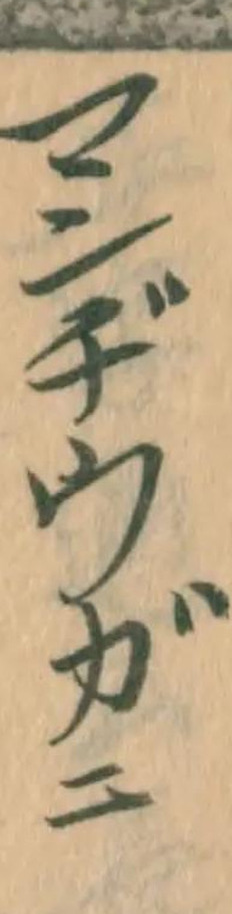マンヂウガニ
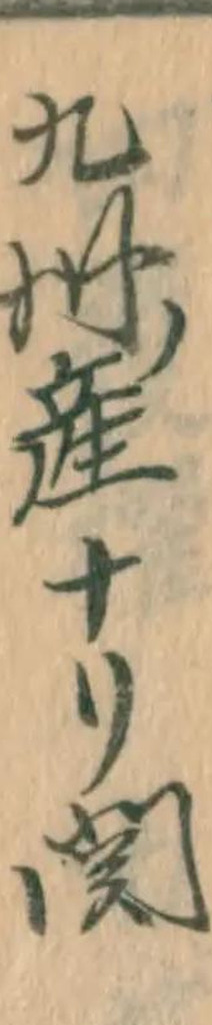九州産ナリ関
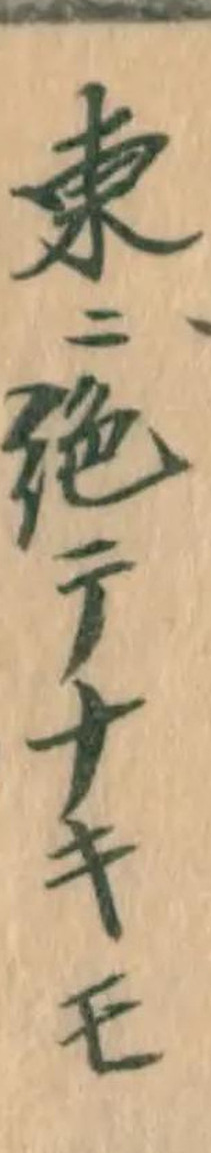東ニ絶テナキモ
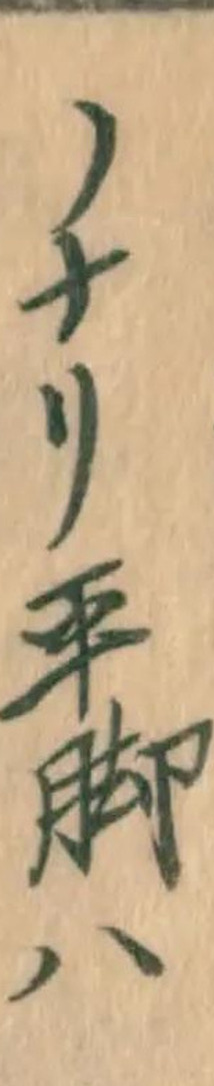ノナリ平脚ハ
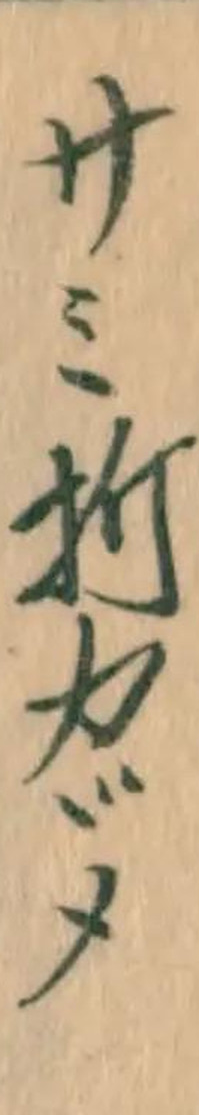サミ折カヾメ
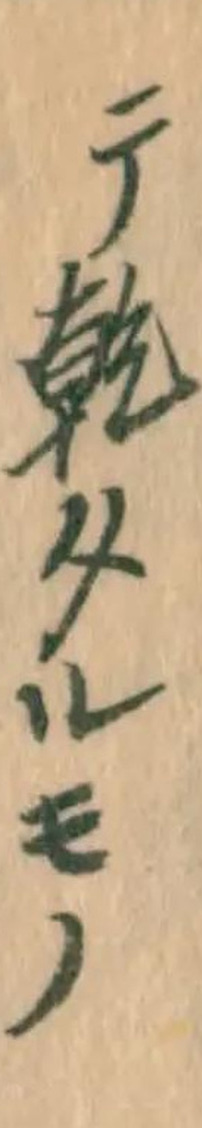テ乾タルモノ
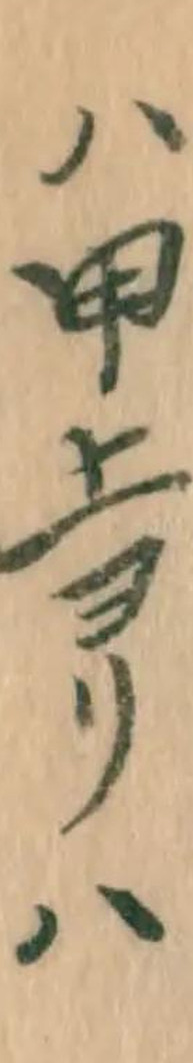ハ甲上ヨリハ
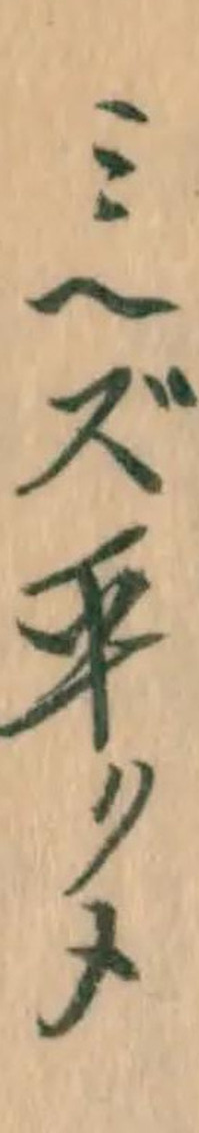ミヘズ平クシテ
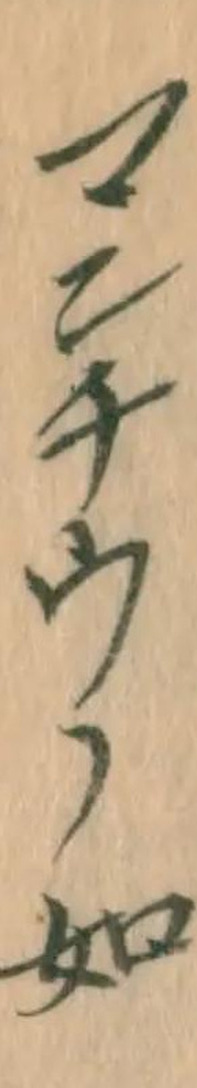マンチウノ如
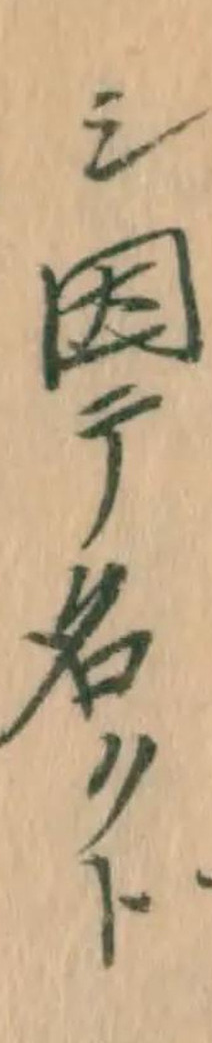シ因テ名クト
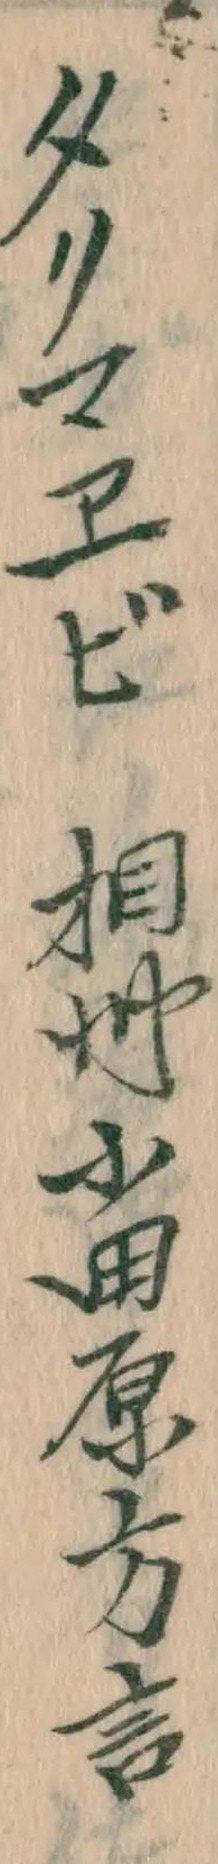タクマヱビ相州小田原方言
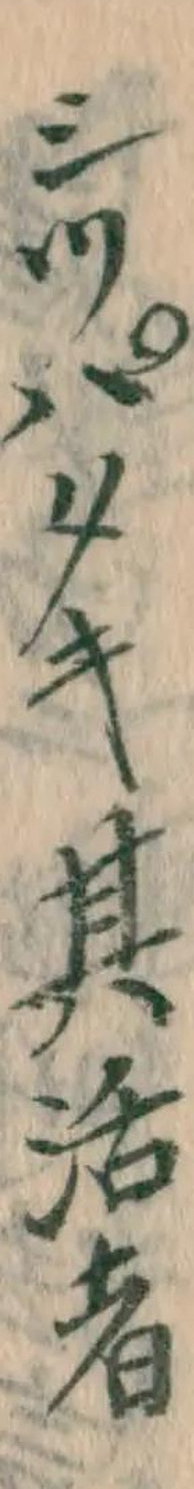シツパタキ其活者
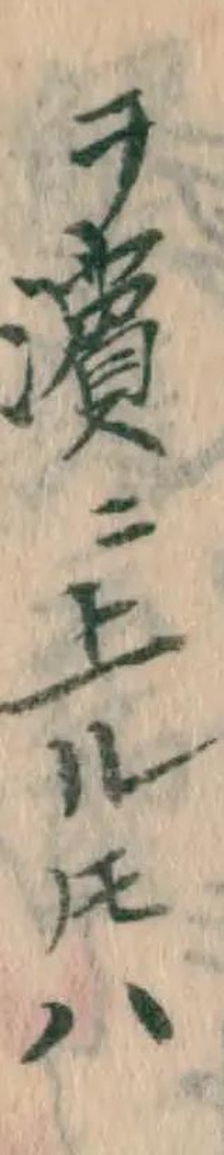ヲ濱ニ上ルトモハ
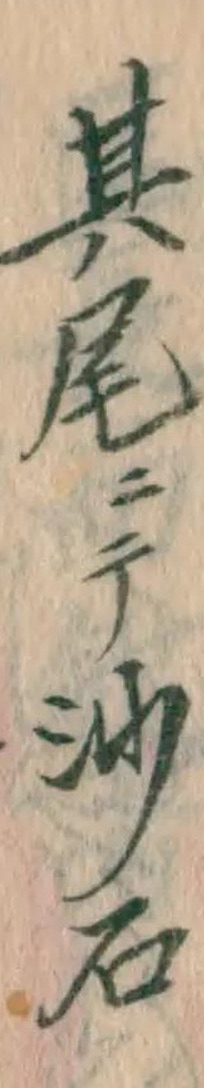其尾ニテ沙石
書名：千蟲譜 3巻. [2]
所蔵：国立国会図書館 National Diet Library, JAPAN
